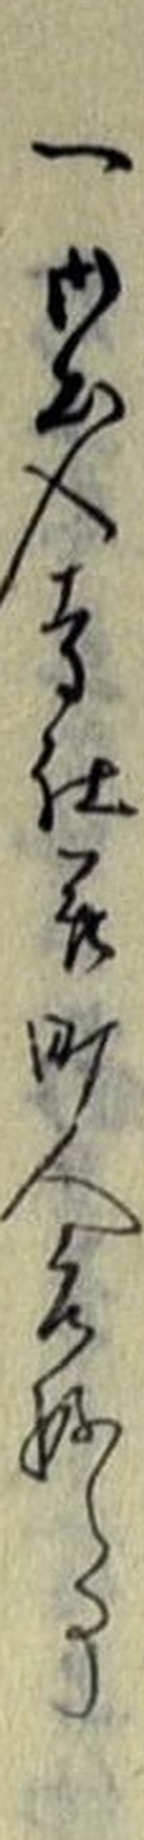一御出入寺社並町人取扱之事
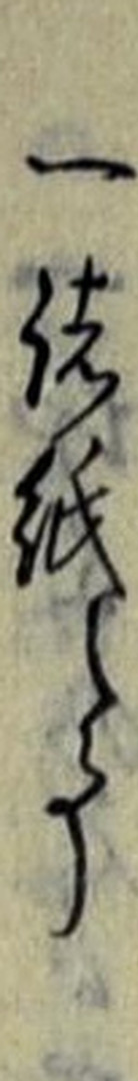一諸紙之事
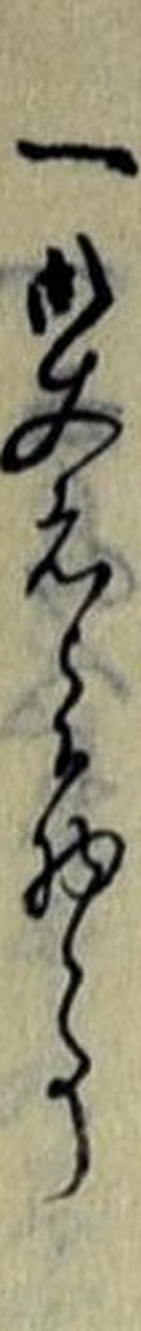一御使者被下物之事
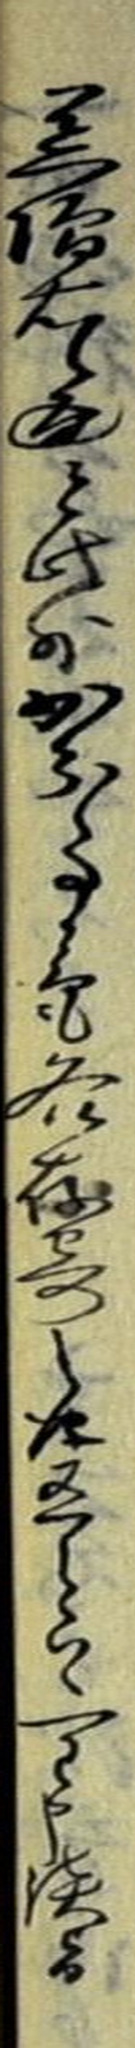荒増右之通に候此外少分之事に而も各存寄之儀有之候はゝ可被申談旨
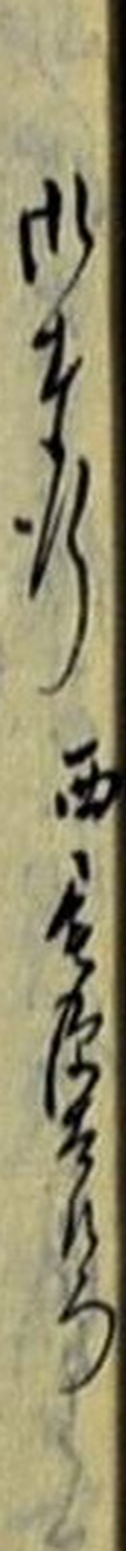御奉行西尾源太左衛門
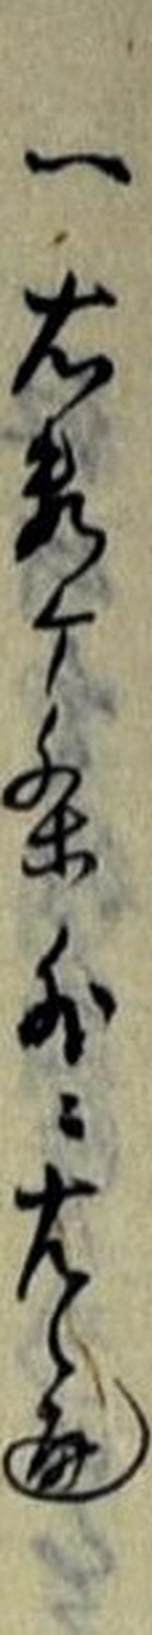一右数ヶ条外に左之通
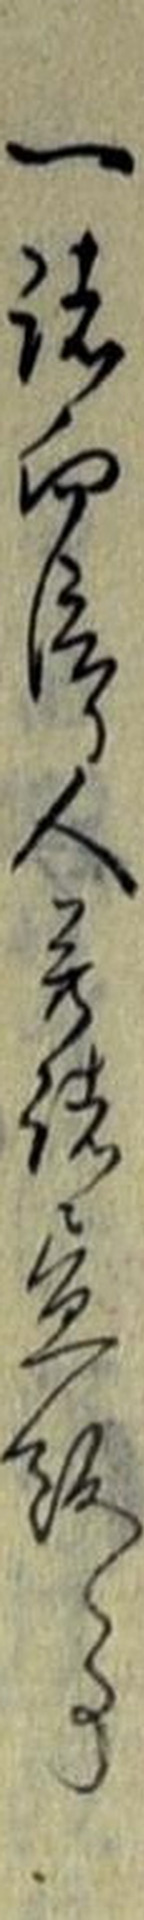一諸向渡り人并諸昼飯之事
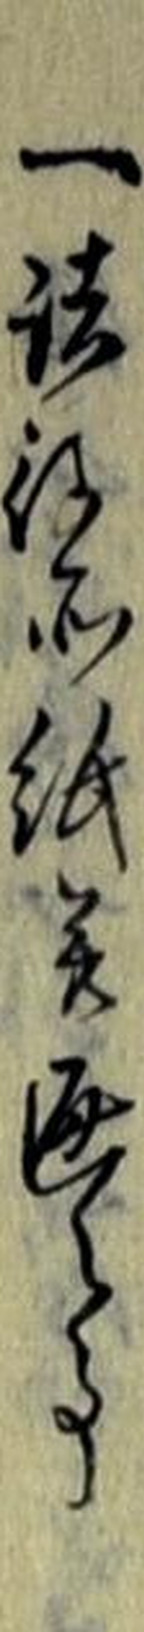一諸役所紙并通之事
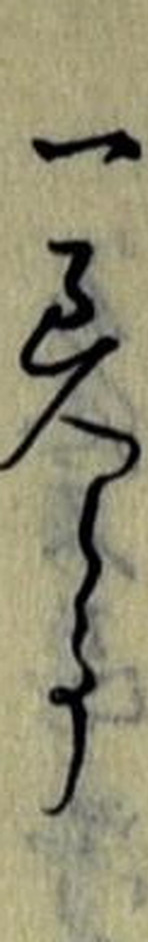一過人之事
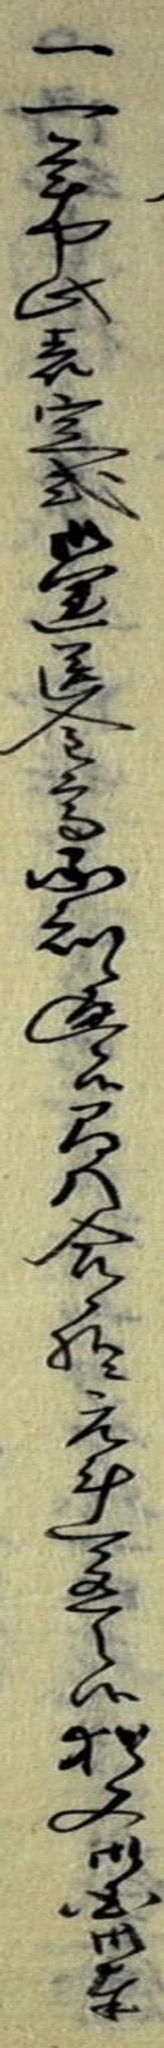一一年中此表定式御運送金高承知之通に候間引合候様に取斗可有之候猶又御国御奉
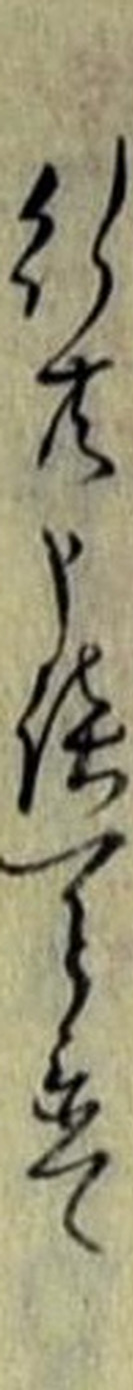行共申談可被置候
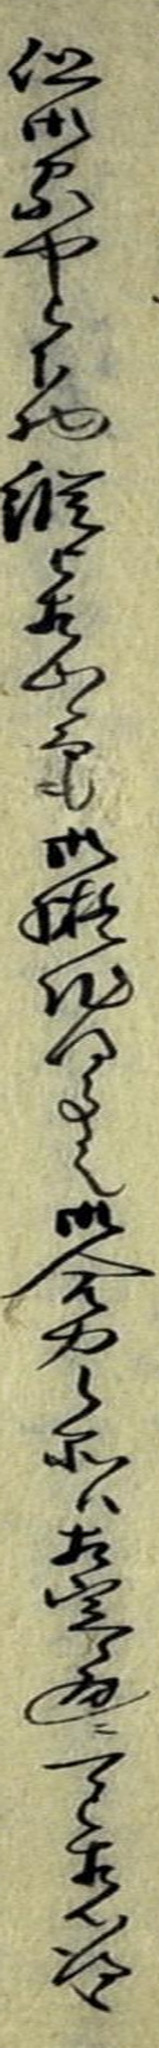但御家中被下物縦被相止候而も御擬作同事之御合力之品は相定之通に可被相心得候
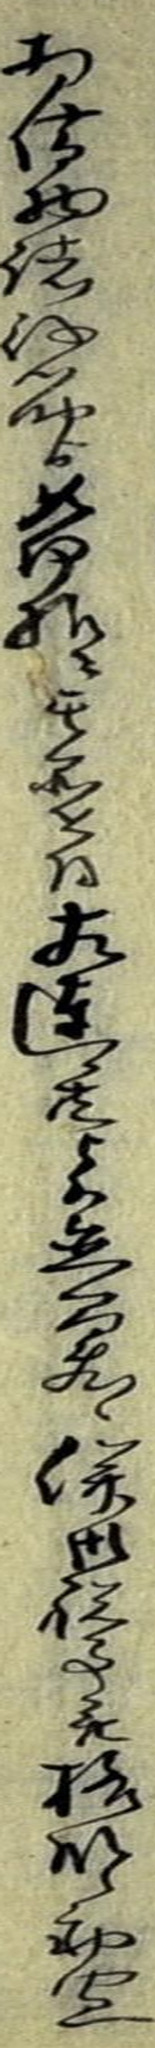一拝借物諸役所筋ゟ如何様に其品と同相達候共被下置間敷候併御祝事并格段之勤宜
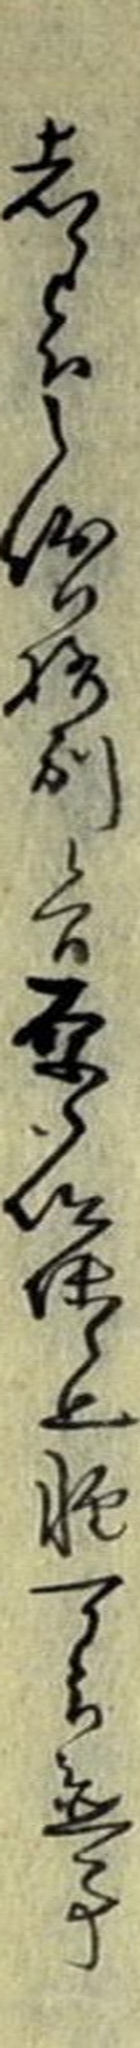者へ被下之儀は格別候間厚御吟味之上軽可被下置事
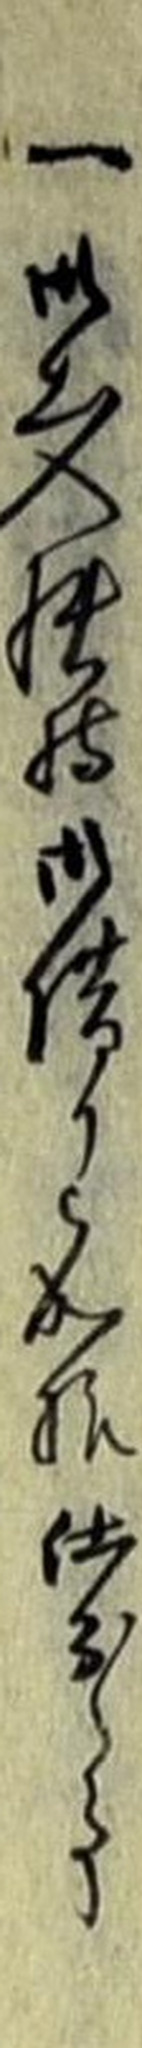一御出入扶持御借り被成様仕分之事
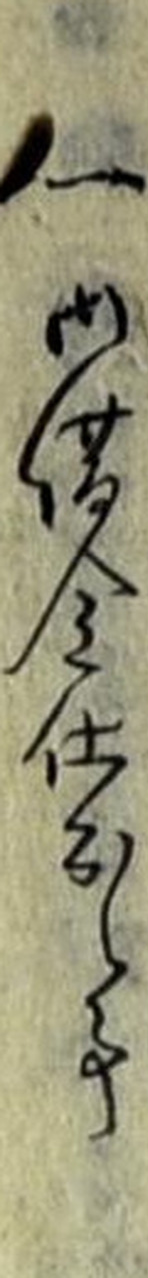一御借金仕分之事
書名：命令之部 二
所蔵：福井県文書館 Fukui Prefectural Archives
